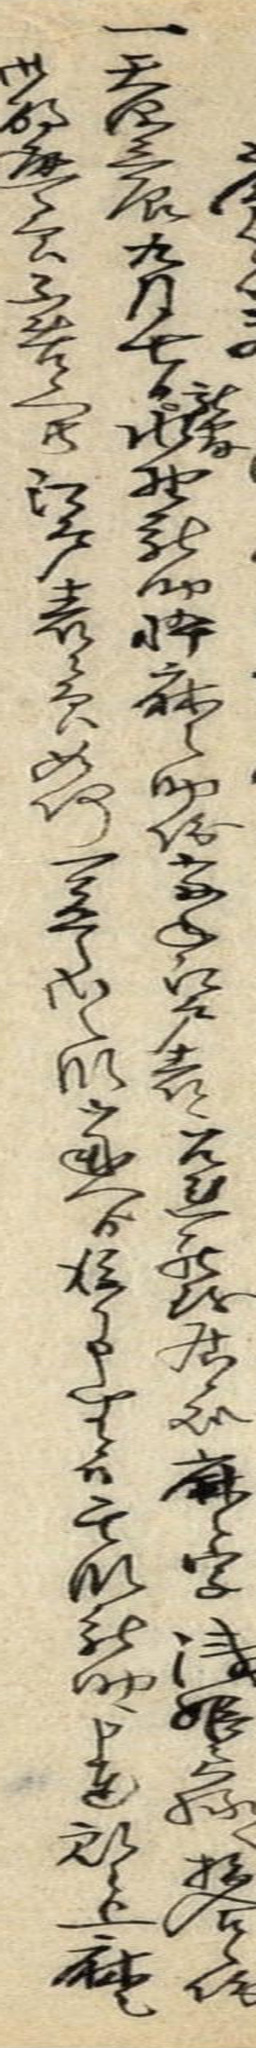御触通に而は不苦候へ共江戸表に而は如何可有之哉之段御用人ゟ移り申聞候に付其段新助へ申達願之上麻之
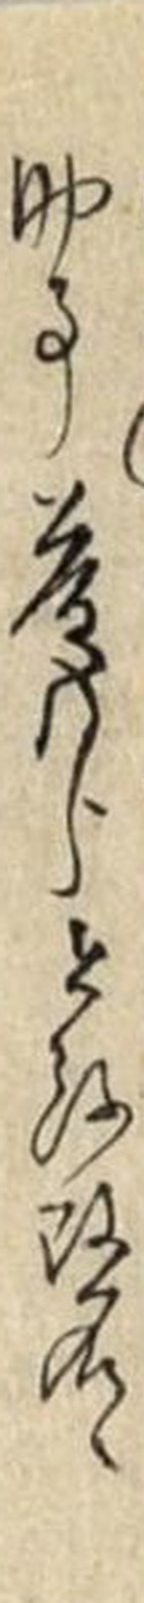助事藤八郎と致改名候

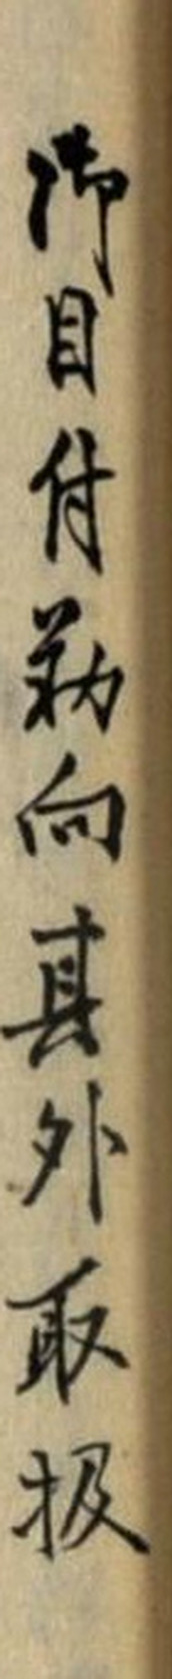御目付勤向其外取扱
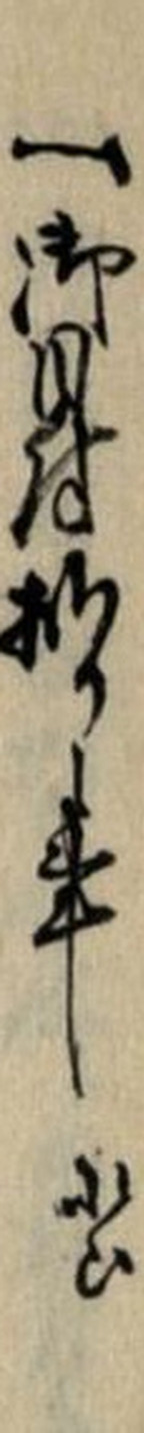一御目付掛り事玉玉
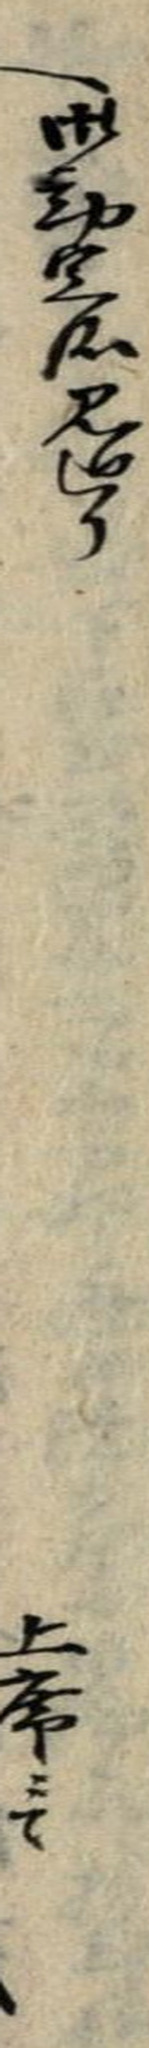御勘定所見廻り上席にて
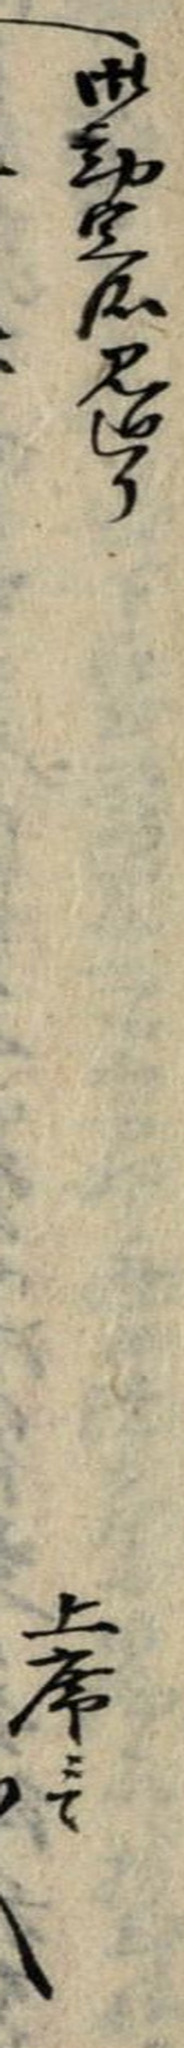御勘定所見廻り上席にて
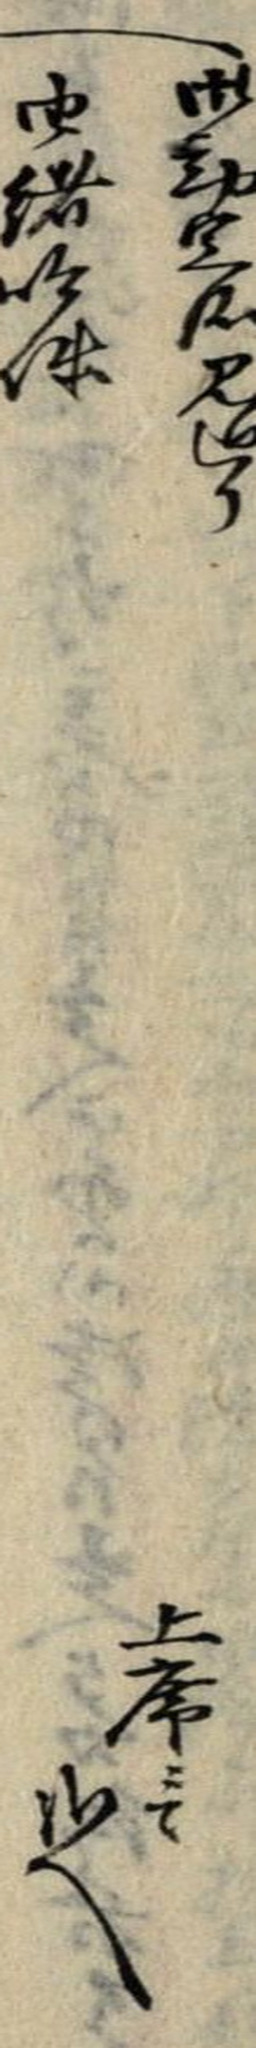由緒吟味弐人
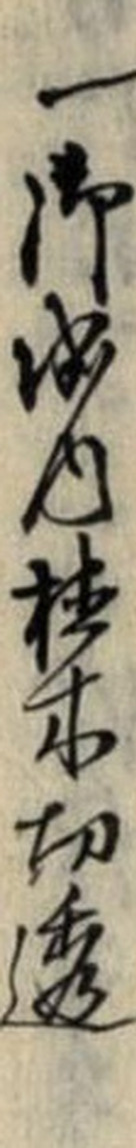御城内植木切透
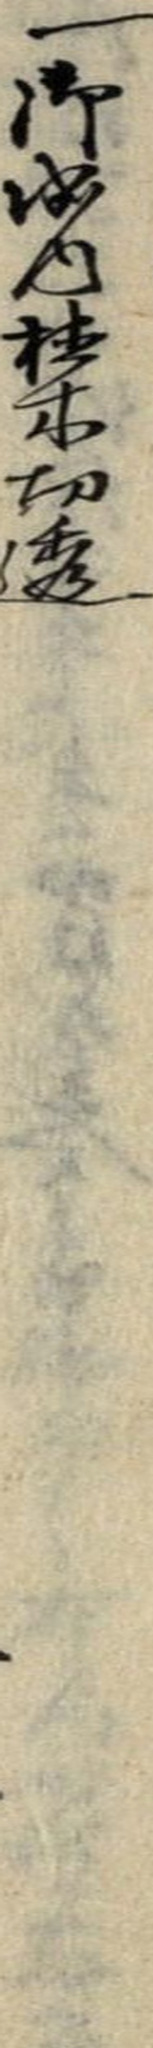御城内植木切透
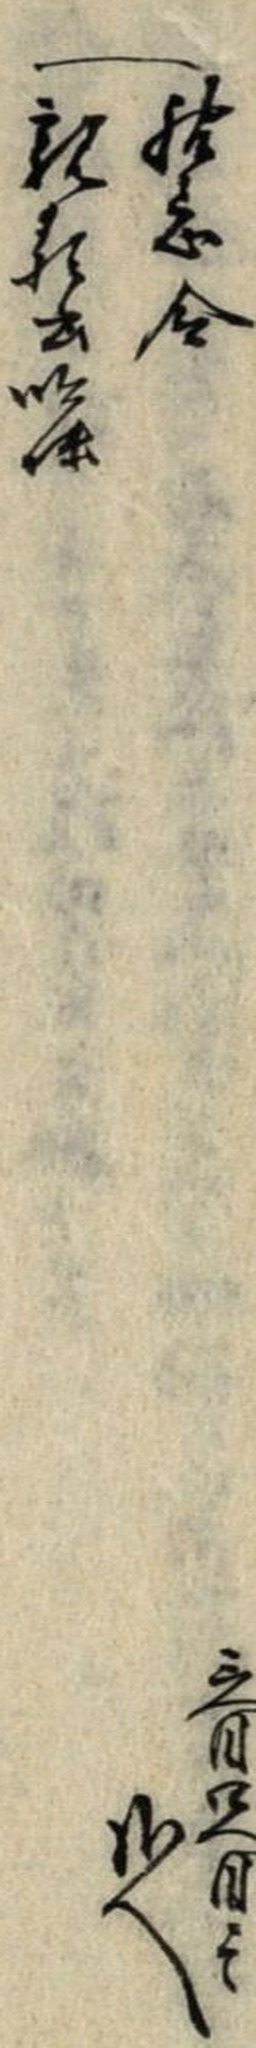親類書吟味弐人
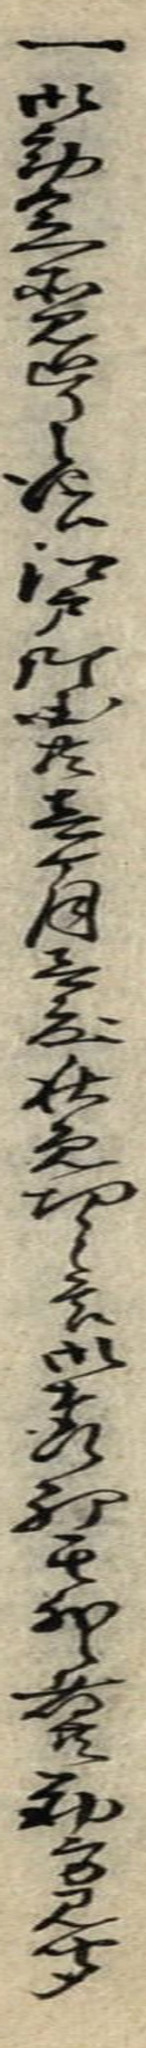一御勘定所見廻り之儀は江戸御国共壱ヶ月壱度秋免切之節御奉行初其外之者共勤方見聞
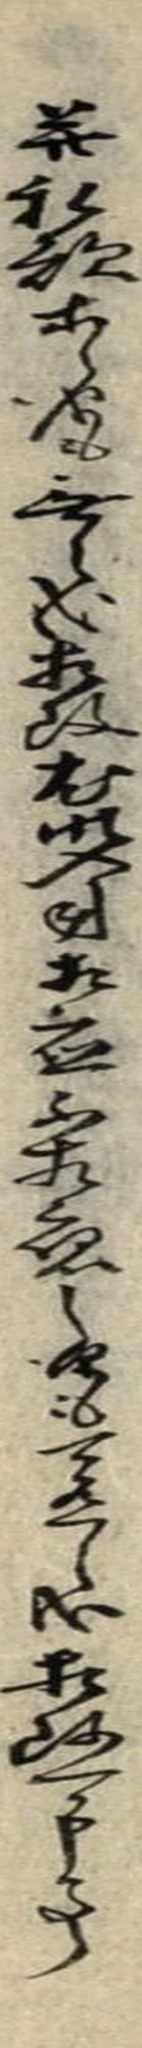并私領等之儀も無之哉相改尤御入用相応不相応之儀も可有之候哉相改可申事
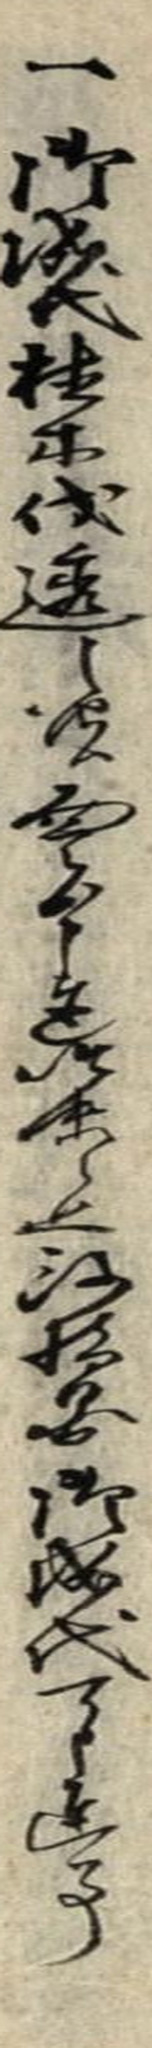一御城代植木伐透之儀は面々ゟ申達吟味之上致指図御城代可申達候事
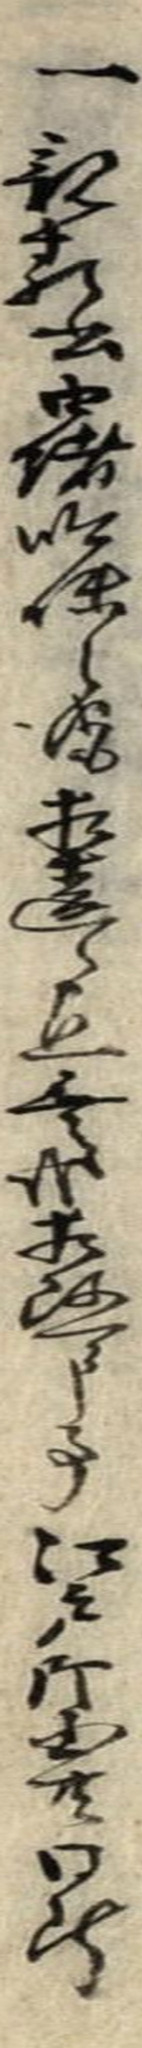一親類書由緒吟味之儀も相違申上無之哉相改可申事江戸御国共同断
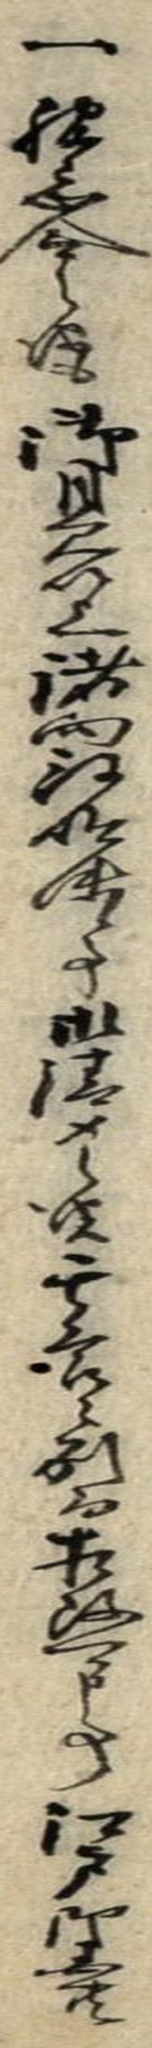一服忌令之儀も御目見以上諸向致吟味候事御清メ之儀は其節に別而相改可申事江戸御国共
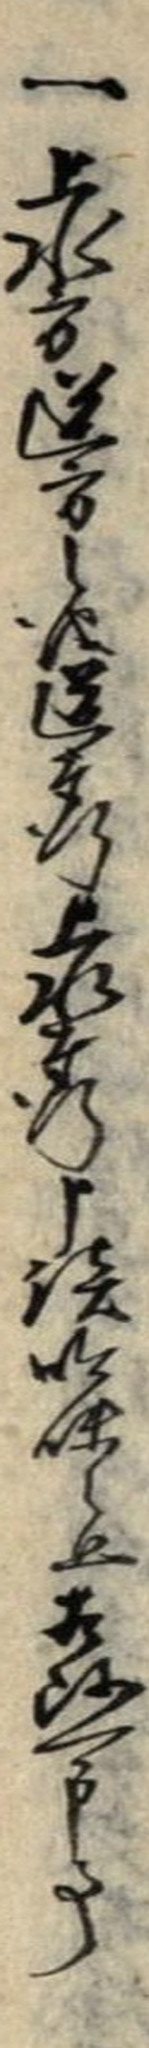一上水方道方之儀道奉行上水奉行申談吟味之上相改可申事
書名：蒐輯之部
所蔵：福井県文書館 Fukui Prefectural Archives
